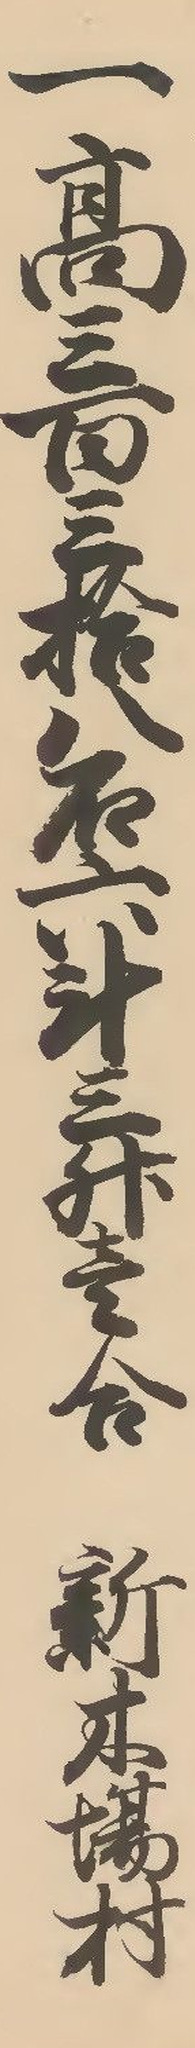一髙三百三拾八石六斗三升壱合新木場村

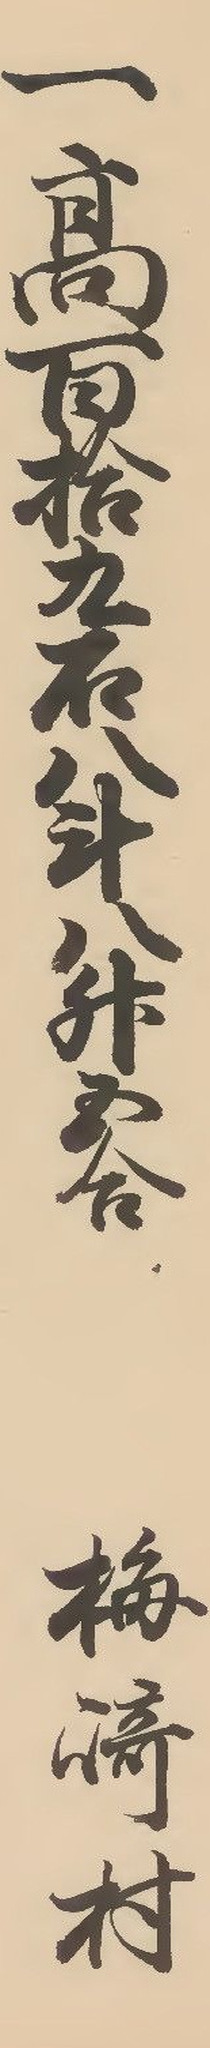一髙百拾九石八斗八升五合梅崎村
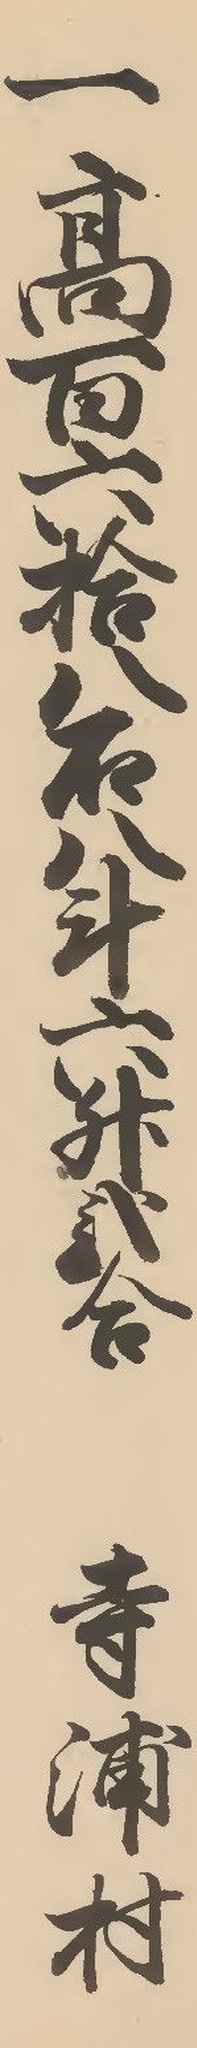一髙百六拾八石八斗六斗弐合寺浦村
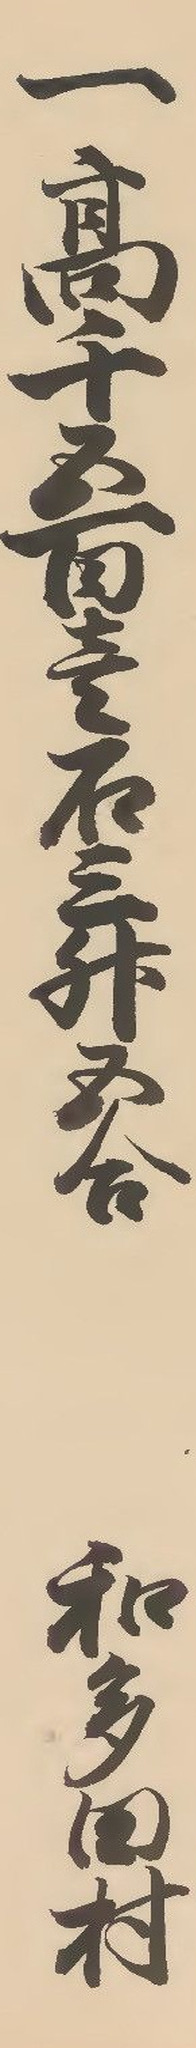一髙千五百壱石三升五合和多田村
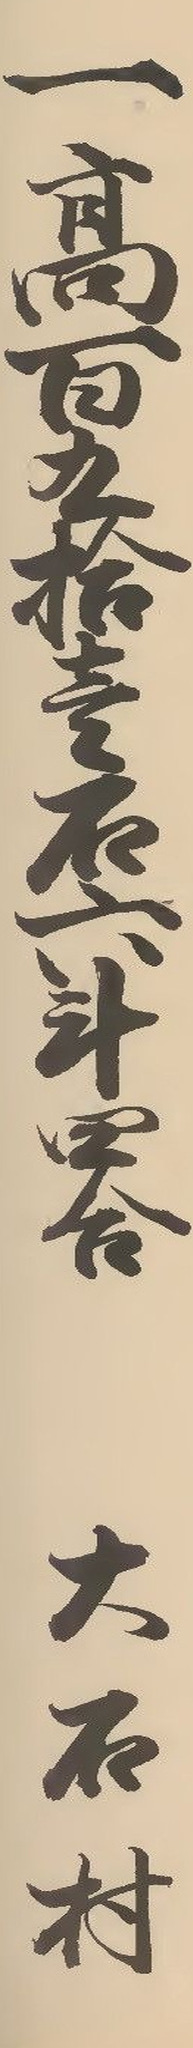一髙百九拾壱石六斗四合大石村
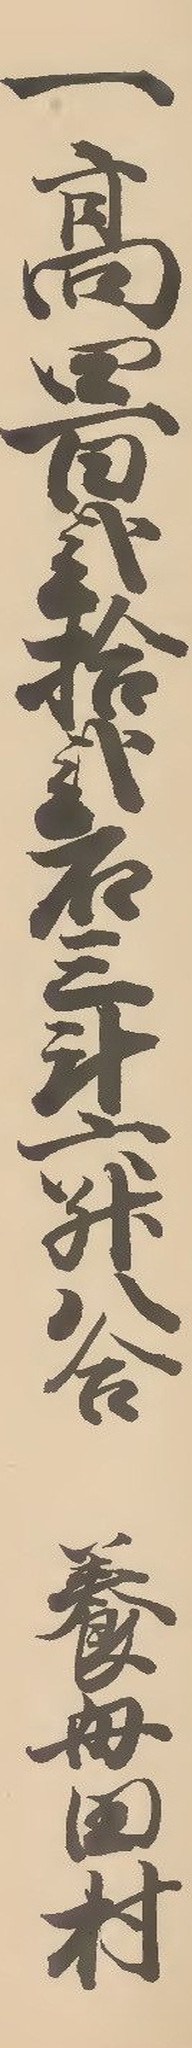一髙四百弐拾弐石三斗六升八合養母田村
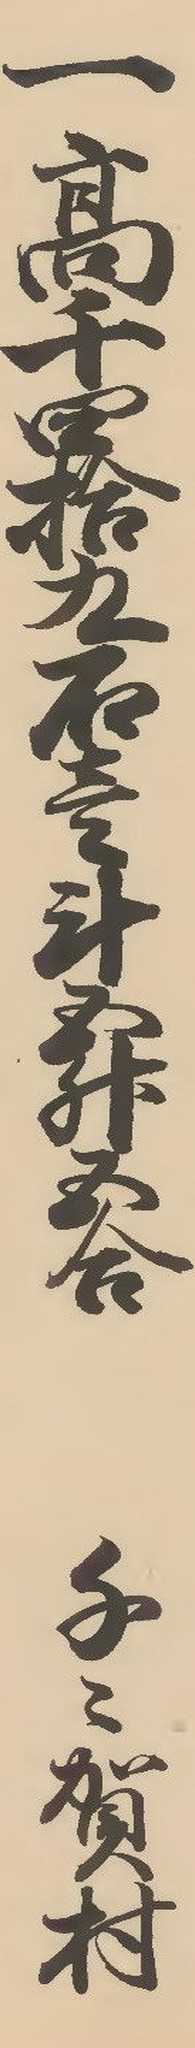一髙千四拾九石壱斗五升五合千々賀村
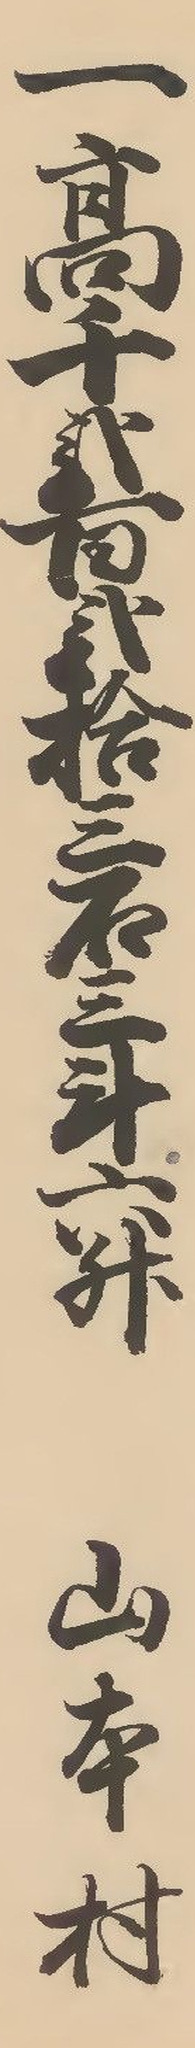一髙千弐百弐拾三石三斗六升山本村
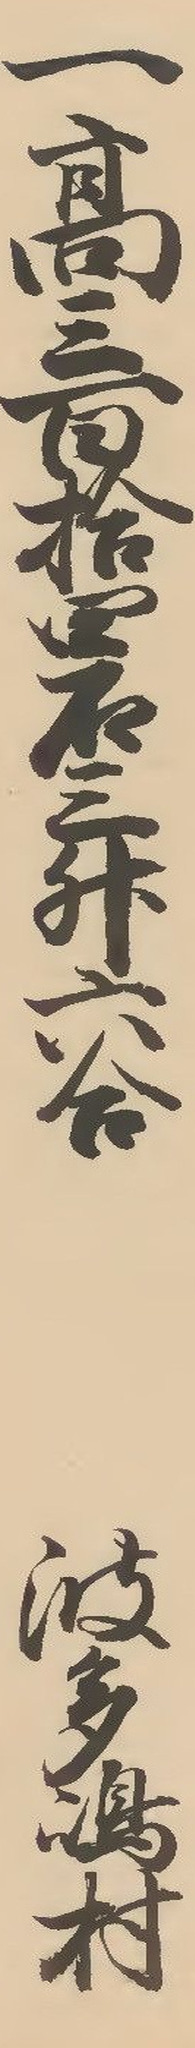一髙三百拾四石三升六合波多嶋村

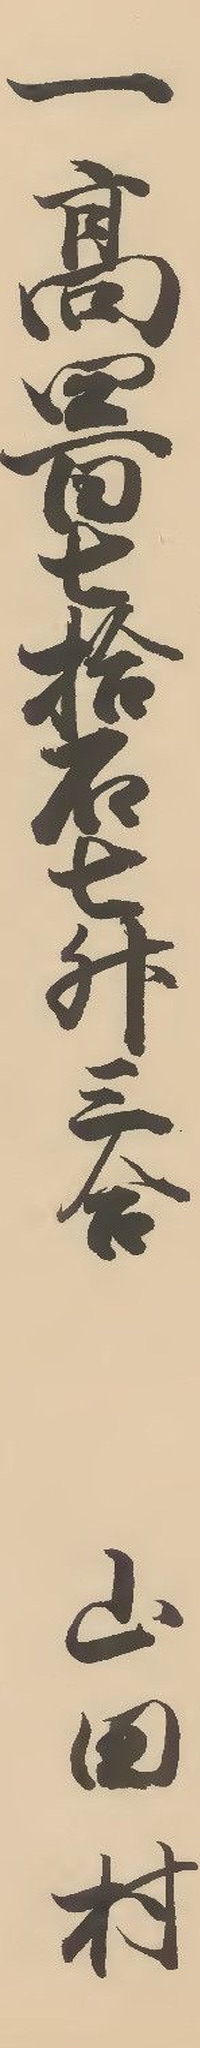一髙四百七拾石七升三合山田村
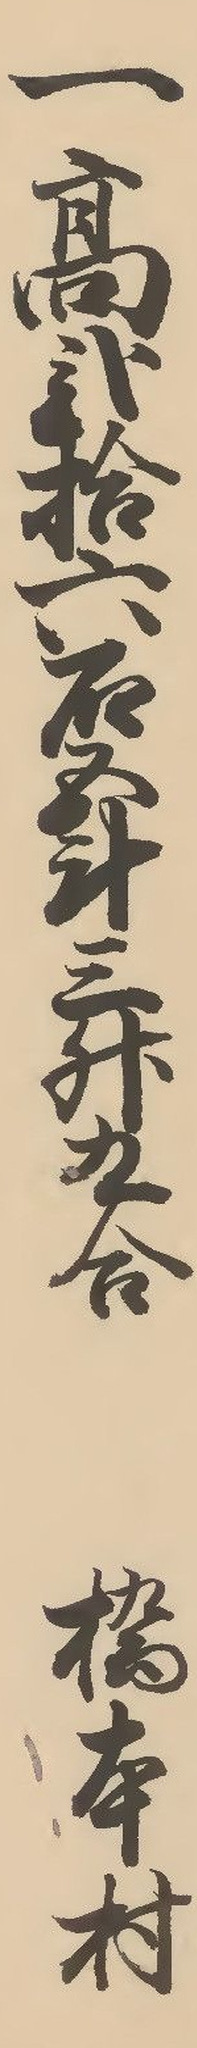一髙弐拾六石五斗三升九合橋本村
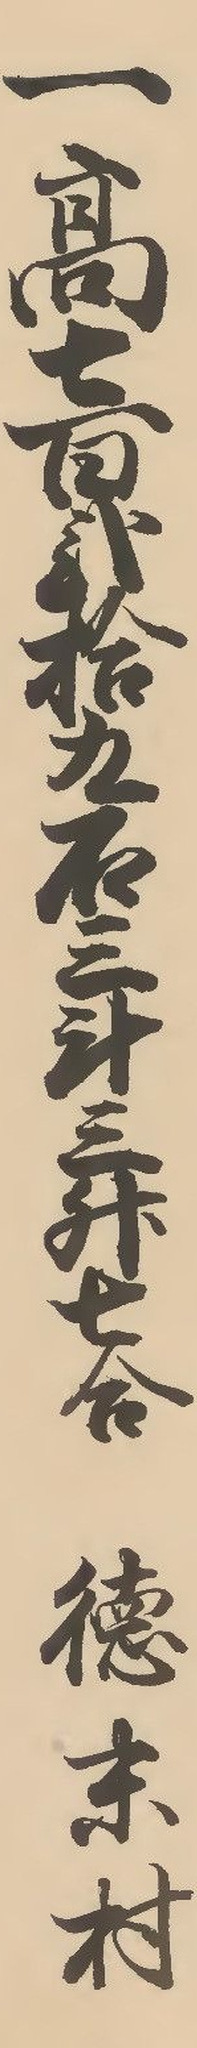一髙七百弐拾九石三斗三升七合徳末村
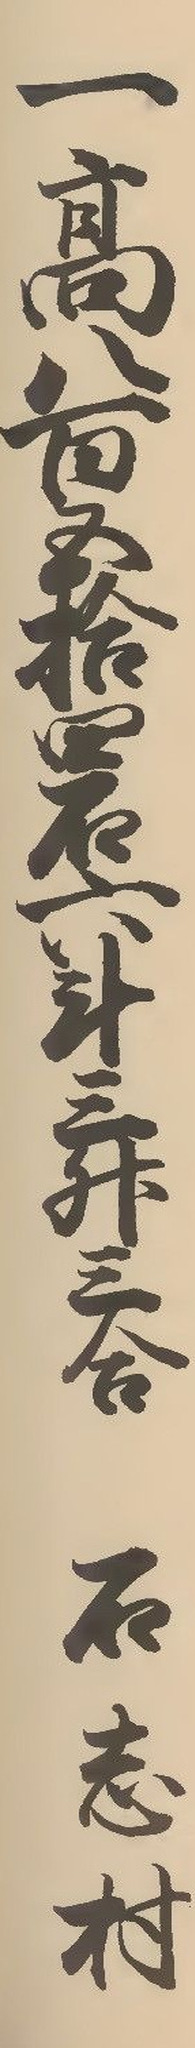一髙八百五拾四石六斗三升三合石志村
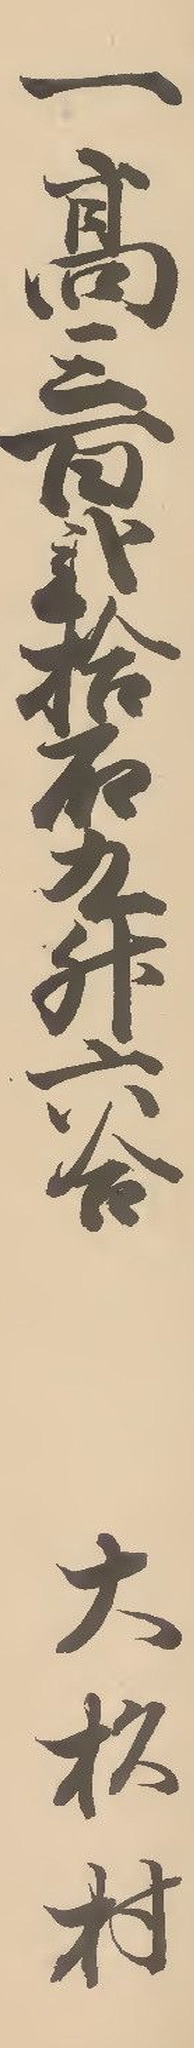一髙三百弐拾石九升六号大杦村
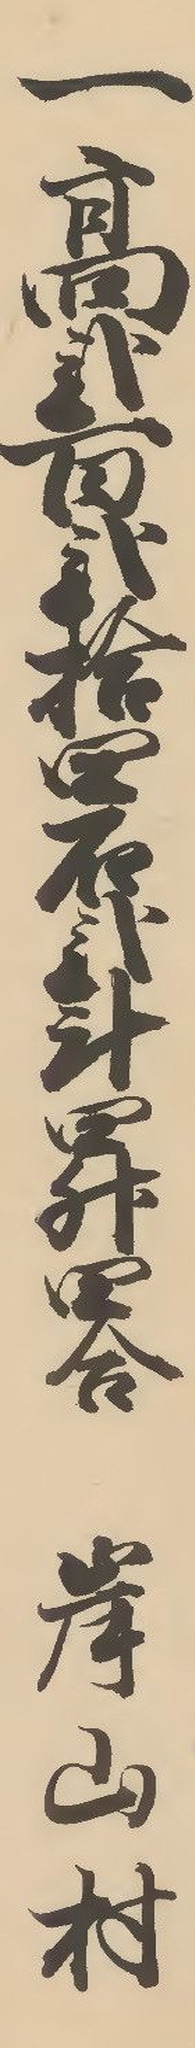一髙弐百弐拾四石弐斗四升四合岸山村
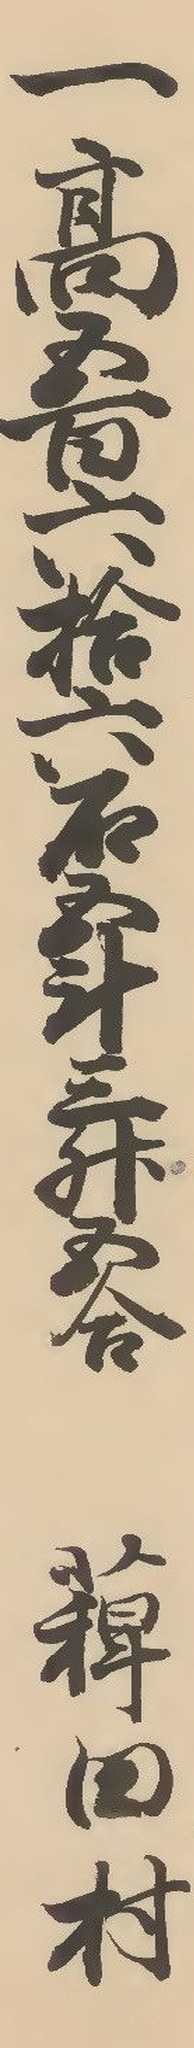一髙五百六拾六石五斗三升五合田村
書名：肥前国郷帳
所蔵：国立公文書館 National Archives of Japan
